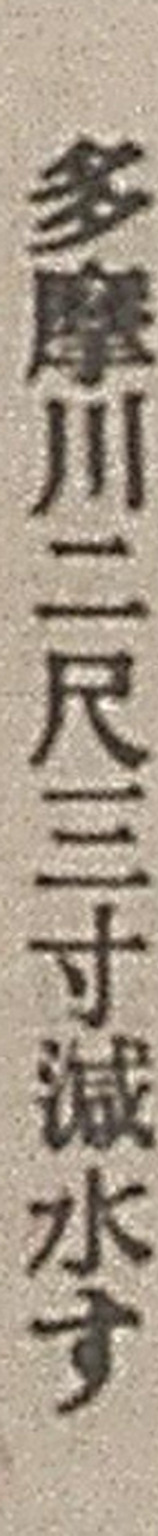多摩川二尺三寸減水す
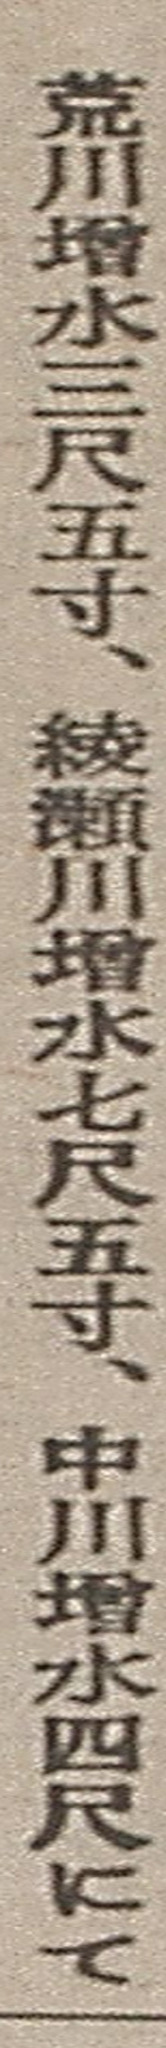荒川増水三尺五寸、綾瀬川増水七尺五寸、中川増水四尺にて
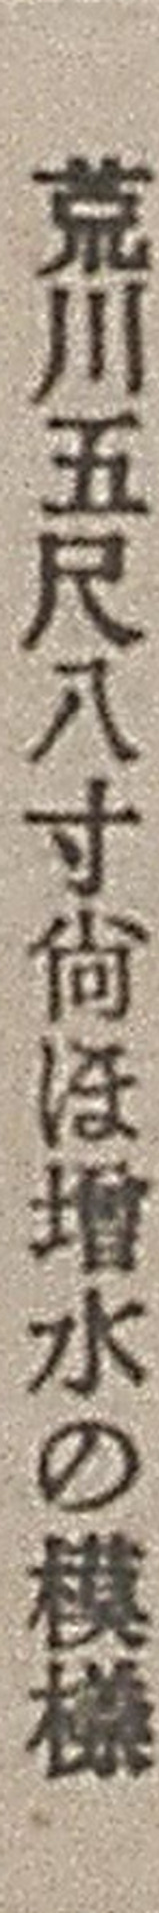荒川五尺八寸尚ほ増水の模様
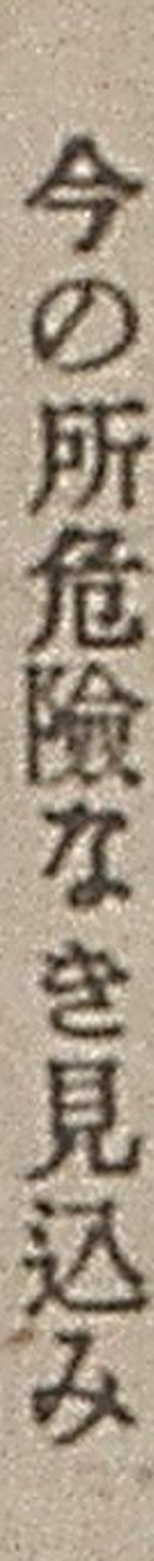今の所危険なき見込み
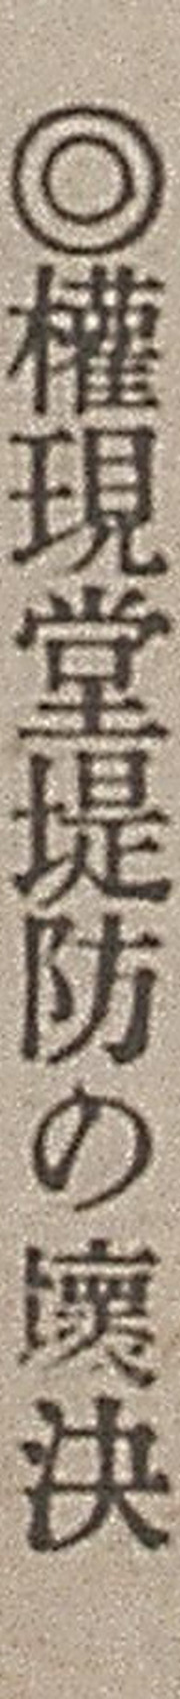◎権現堂堤防の壊決
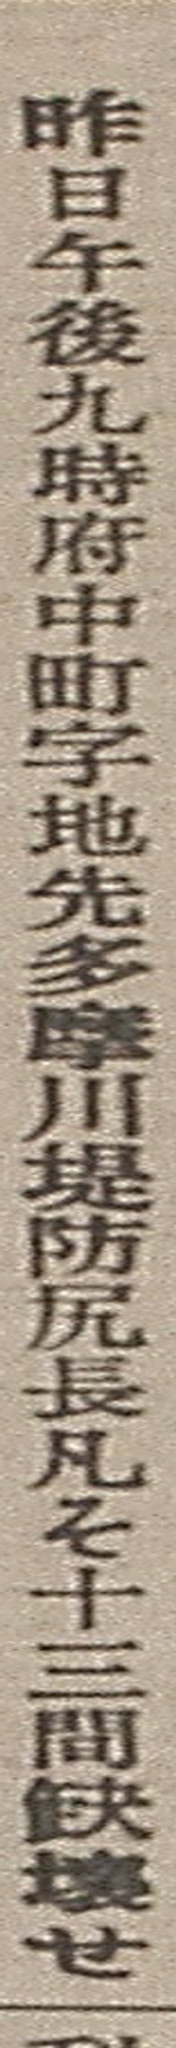昨日午後九時府中町字地先多摩川堤防尻長凡そ十三間缺壊せ
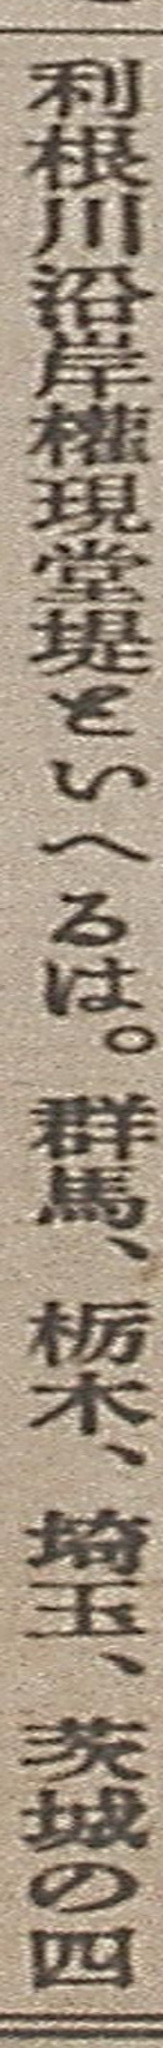利根川沿岸権現堂堤といへるは。群馬、栃木、埼玉、茨城の四
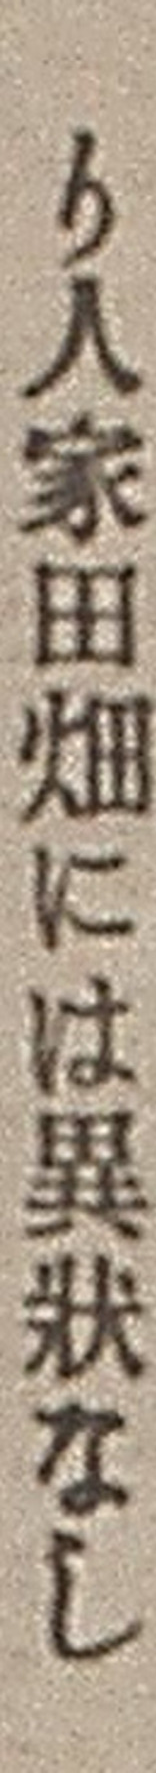り人家典田畑には異状なし
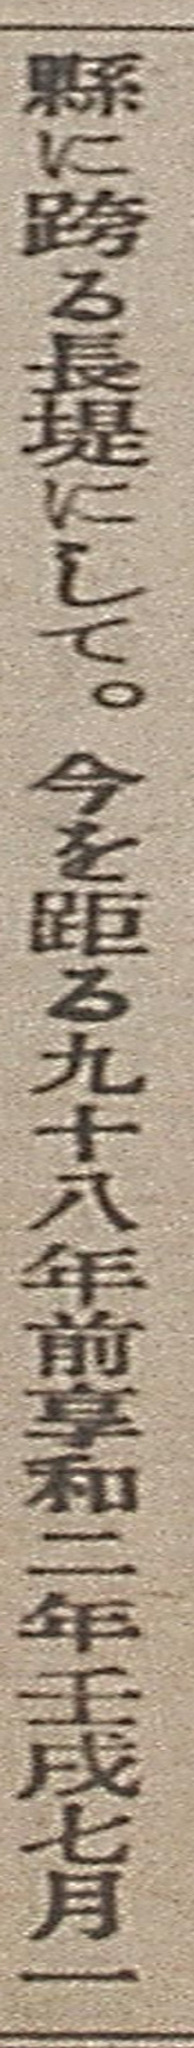県に跨る長堤にして。今を距る九十八年前享和二年壬戌七月一
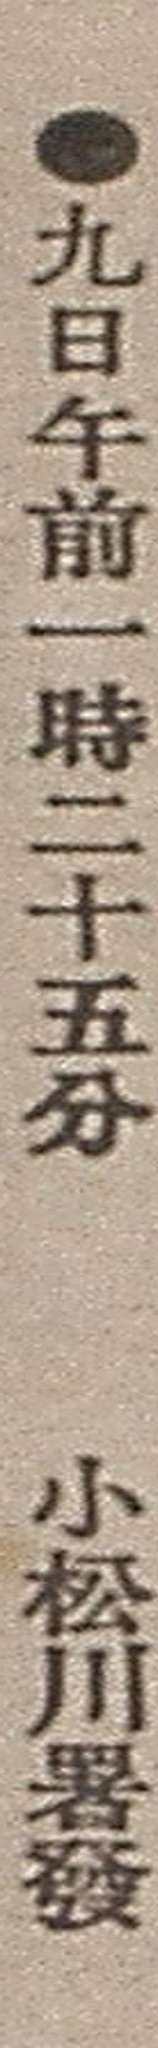●九日午前一時二十五分小松川署発
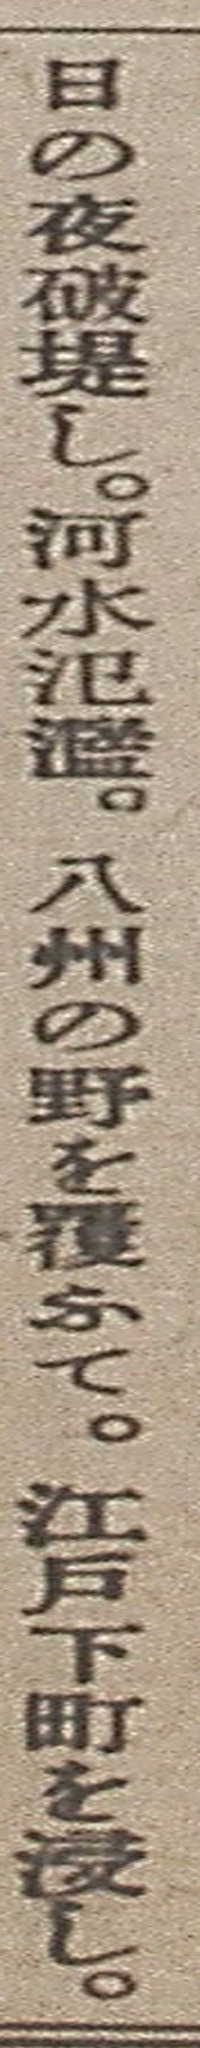日の夜破堤し。河水氾濫。八州の野を覆ふて。江戸下町を浸し。
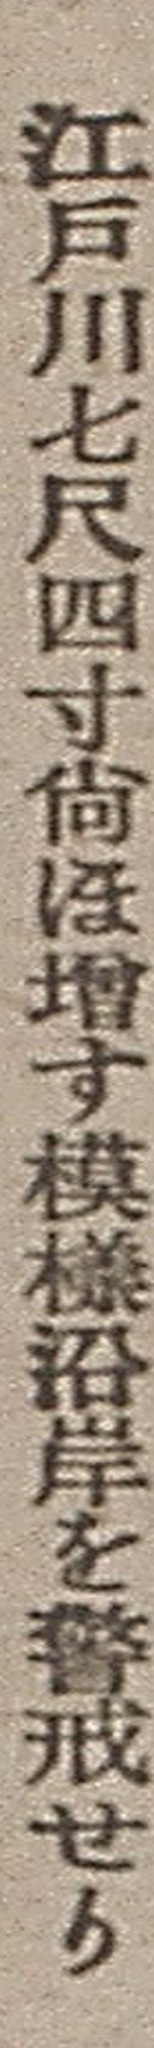江戸川七尺四寸尚ほ増す模様沿岸を警戒せり
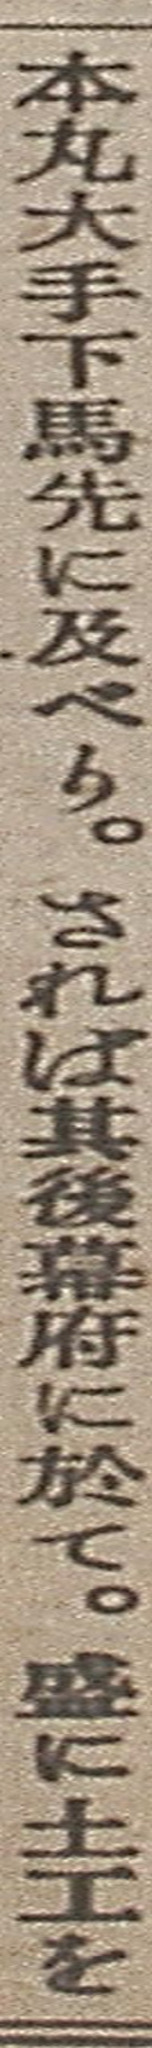本丸大手下馬先に及べり。されば其後幕府に於て。盛に土工を
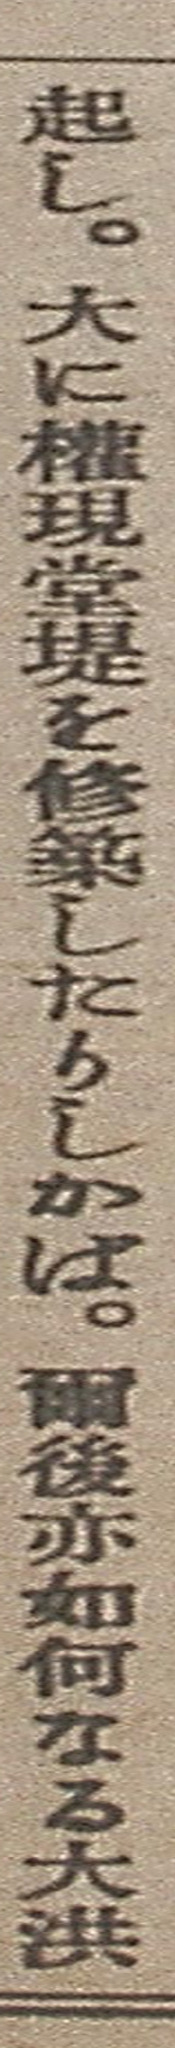起し。大に権現堂堤を修築したりしかば。爾後亦如何なる大洪
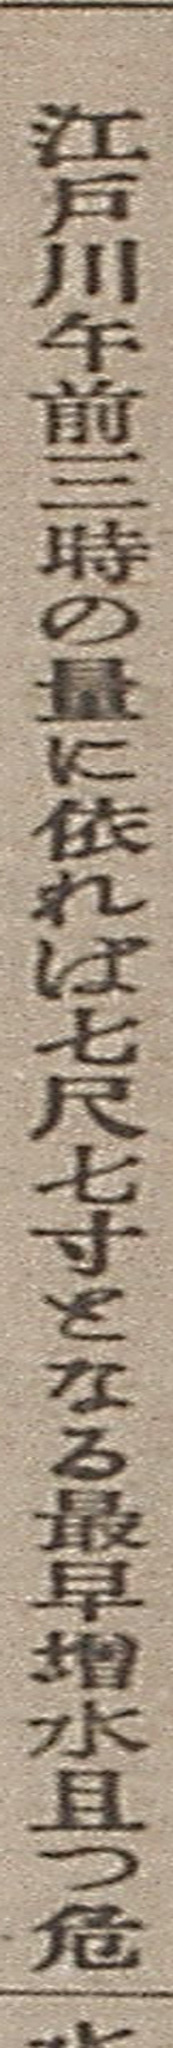江戸川午前三時の量に依れば七尺七寸となる最早増水且つ危
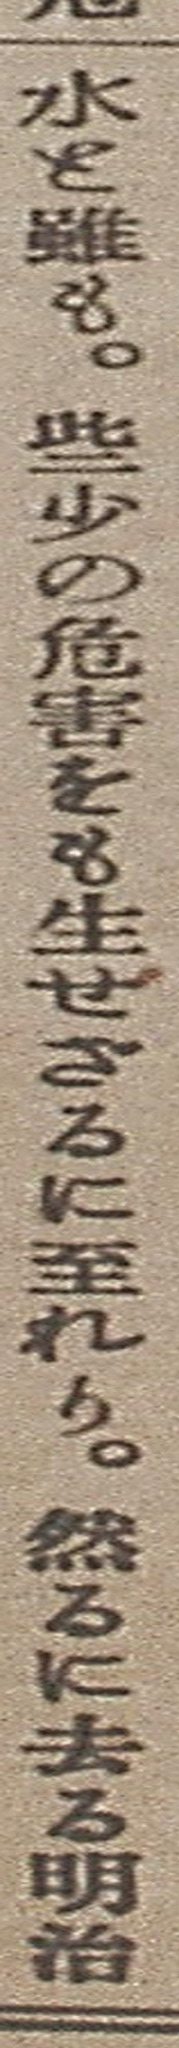水と雖も。些少の危害をも生せざるに至れり。然るに去る明治
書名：風俗畫報臨時増刊第百九十九號　明治三十二年十月各地災害圖會（前編之續）
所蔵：東京大学地震研究所図書室 Earthquake Research Institute Library, The University of Tokyo, JAPAN
